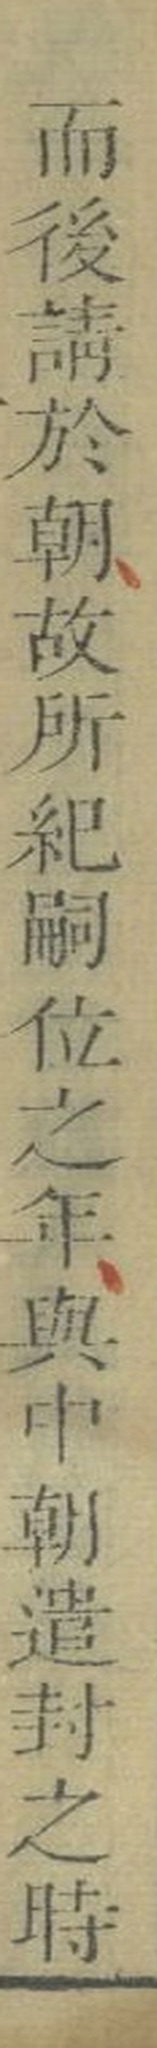而後請於朝故所紀嗣位之年与中朝遣封之時
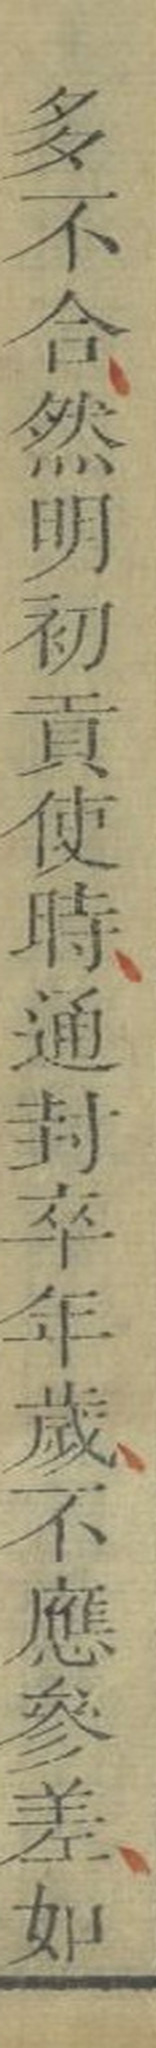多不合然明初貢使時通封卒年歳不応参差如
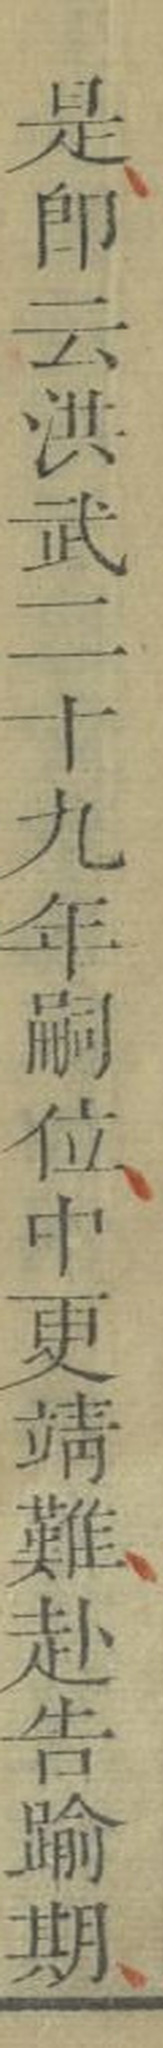是即云洪武二十九年嗣位中更靖難赴告踰期
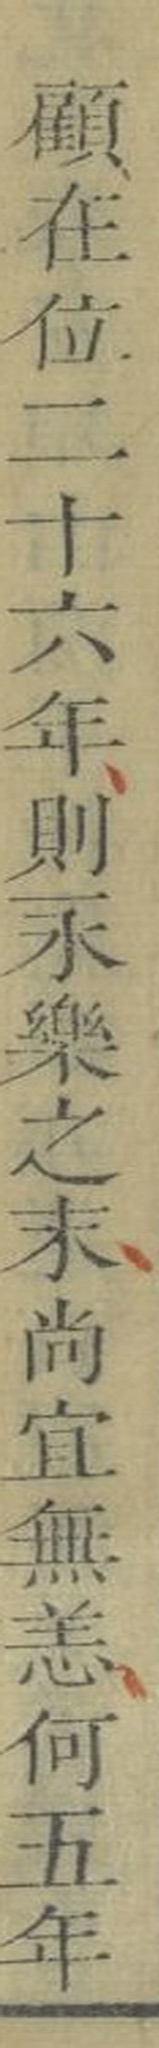顧在位二十六年則永楽之末尚宜無恙何五年
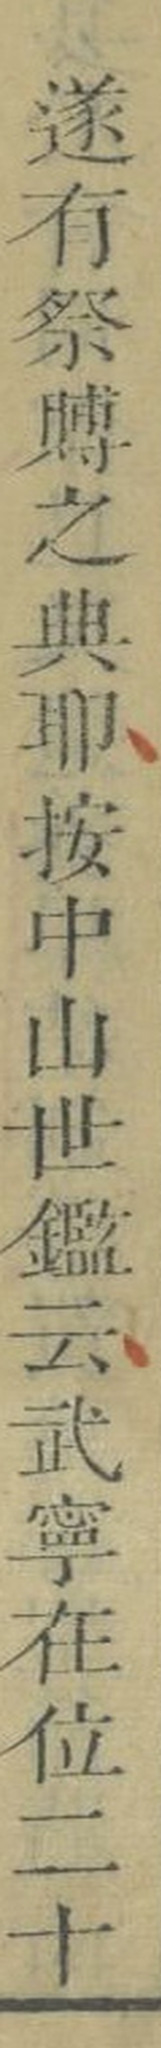遂有祭賻之典耶按中山世鑑云武寧在位二十
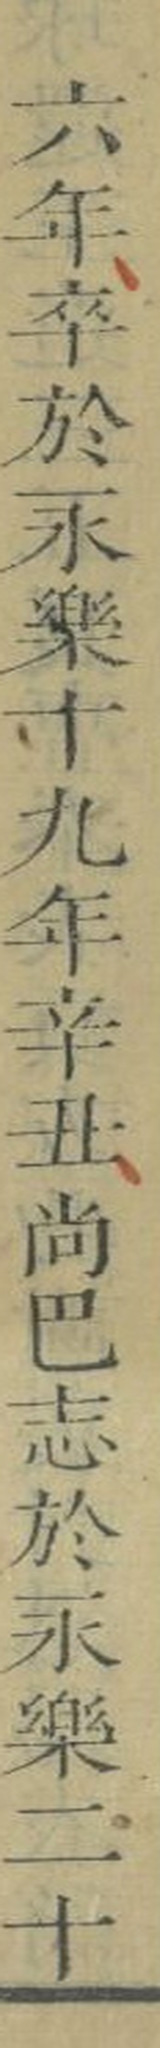六年卒於永楽十九年辛丑尚巴志於永楽二十
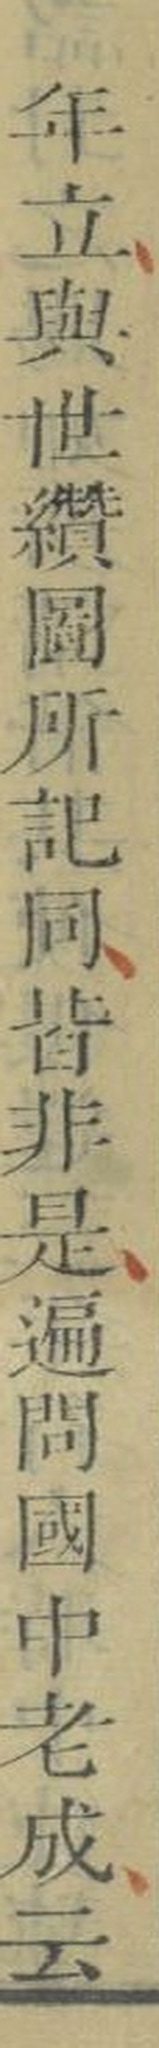年立与世纘図所記同皆非是遍問国中老成云
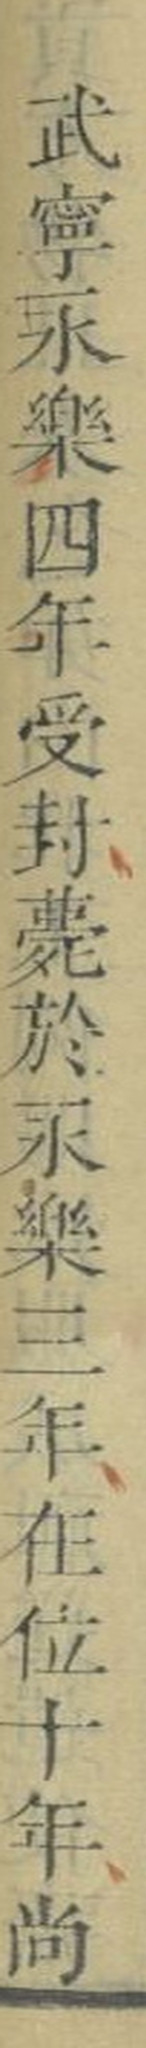武寧永楽四年受封薨於永楽三年在位十年尚
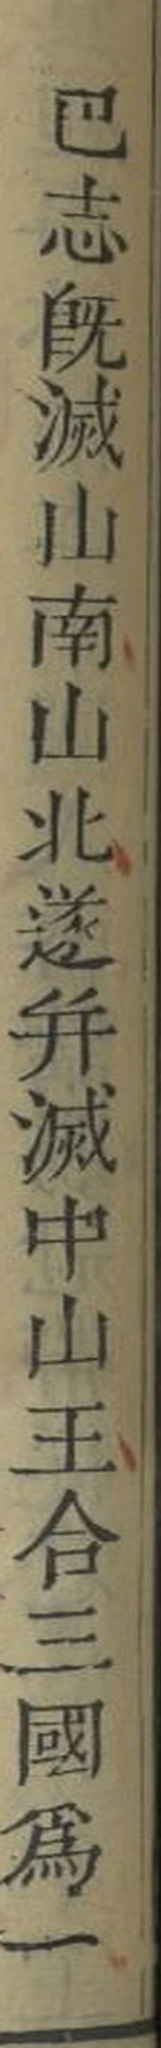巴志既滅山南山北遂并滅中山王合三国為一
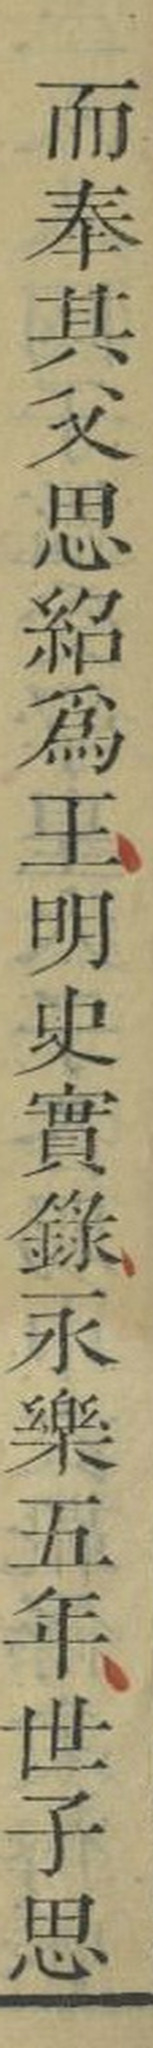而奉其父思紹為王明史実録永楽五年世子思
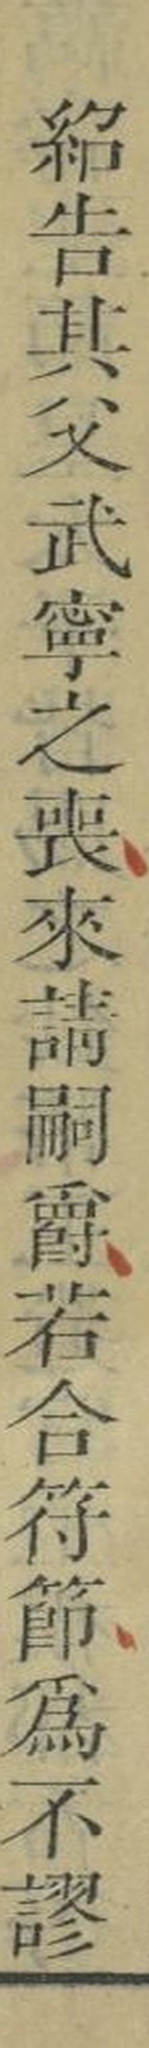紹告其父武寧之喪来請嗣爵若合符節為不謬
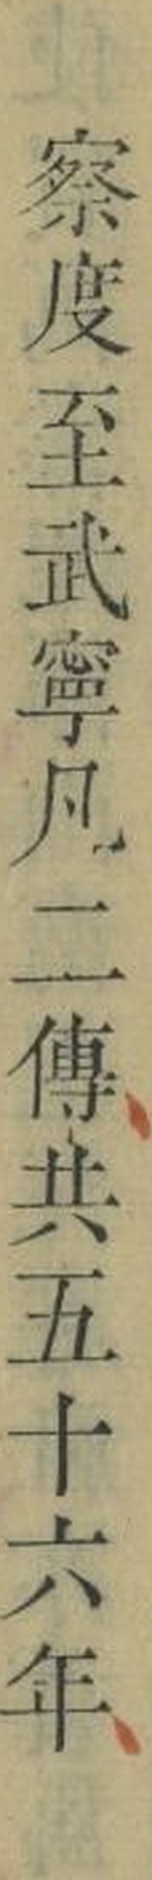察度至武寧凡二伝共五十六年
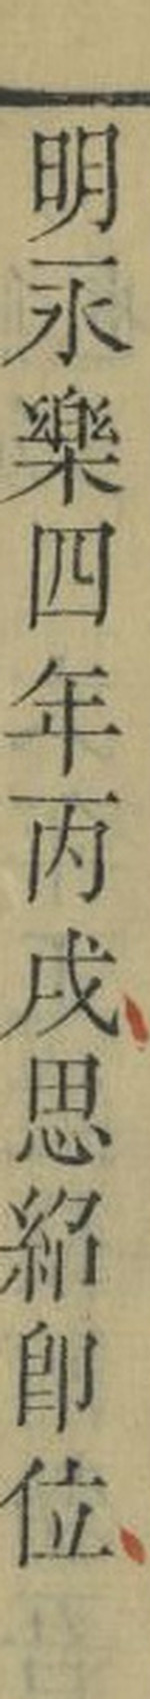明永楽四年丙戌思紹即位
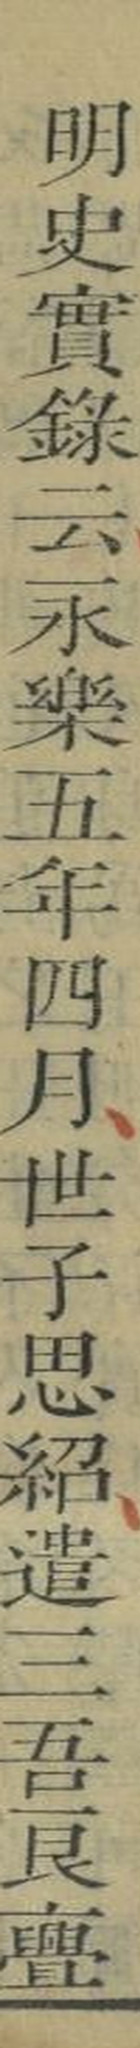明史実録云永楽五年四月世子思紹遣三吾良亹
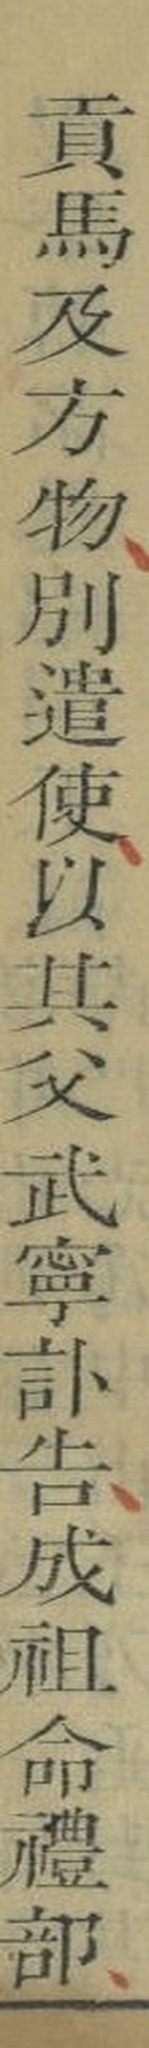貢馬及方物別遣使以其父武寧訃告成祖命礼部

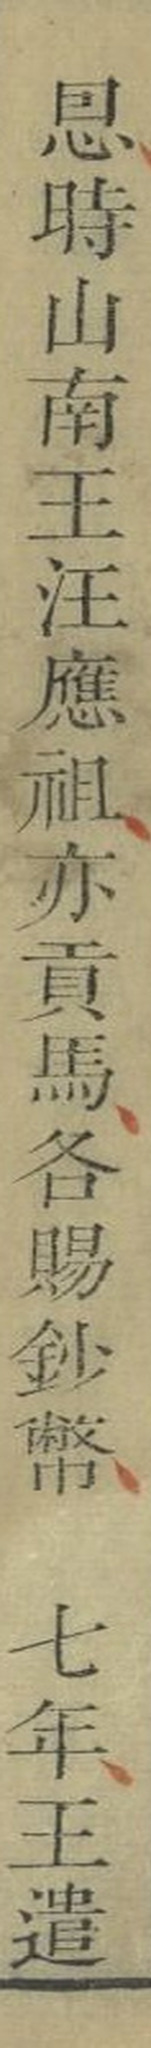恩時山南王汪応祖亦貢馬各賜鈔幣七年王遣
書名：中山伝信録 巻三
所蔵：University of the Ryukyus Library
